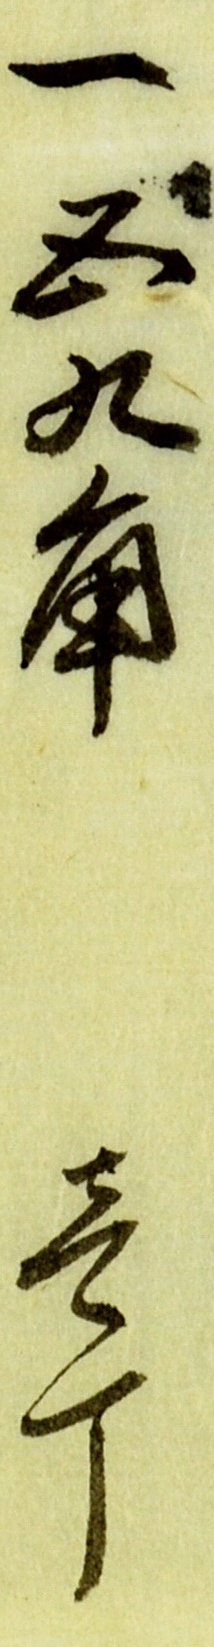一五九角壱丁
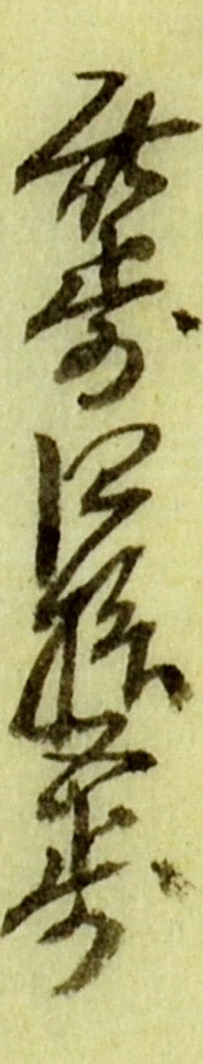此歩四拾五歩
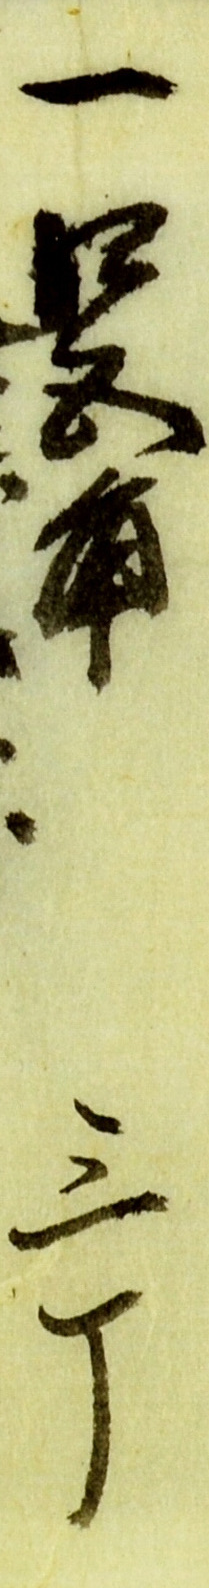一四五角三丁

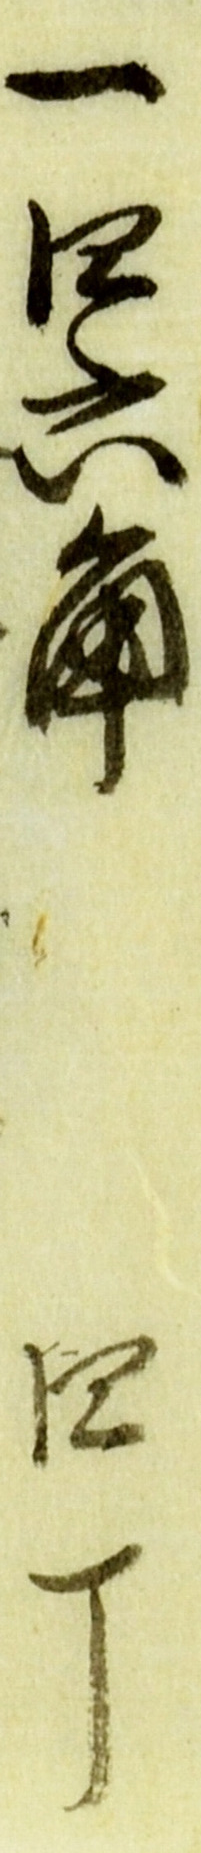一四六角四丁
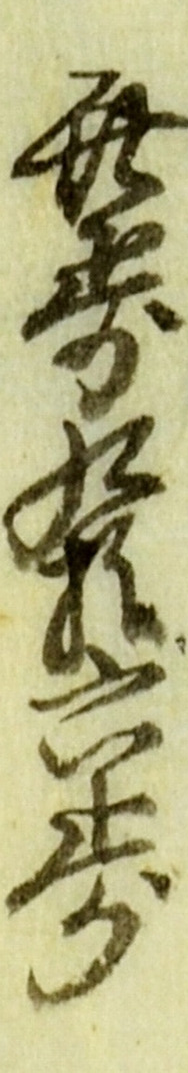此歩九拾六歩
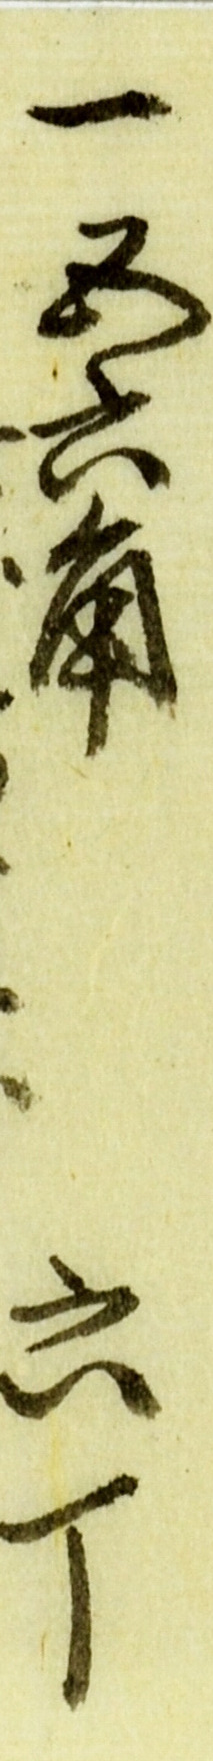一五六角六丁
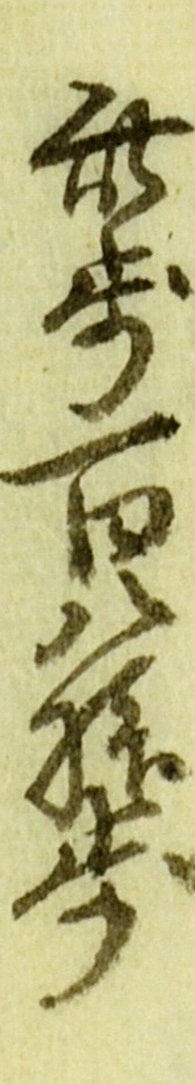此歩百八拾歩
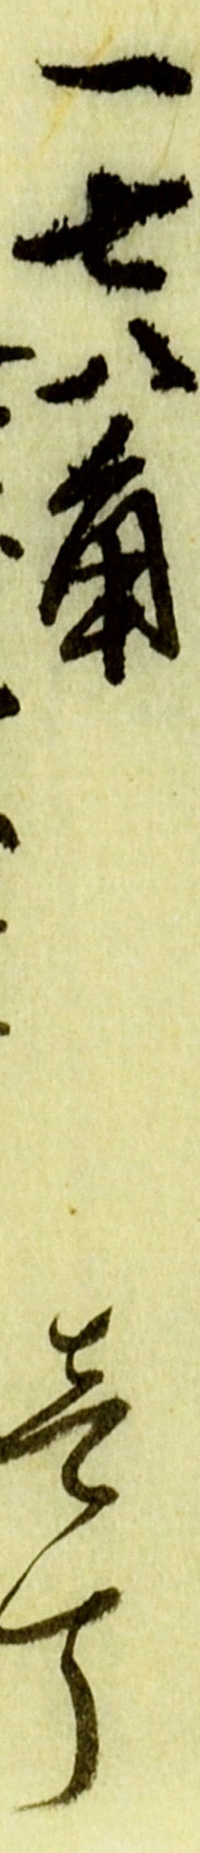一七八角壱丁
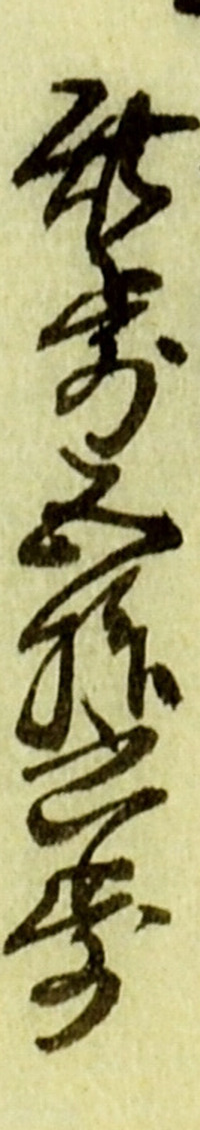此歩五拾六歩
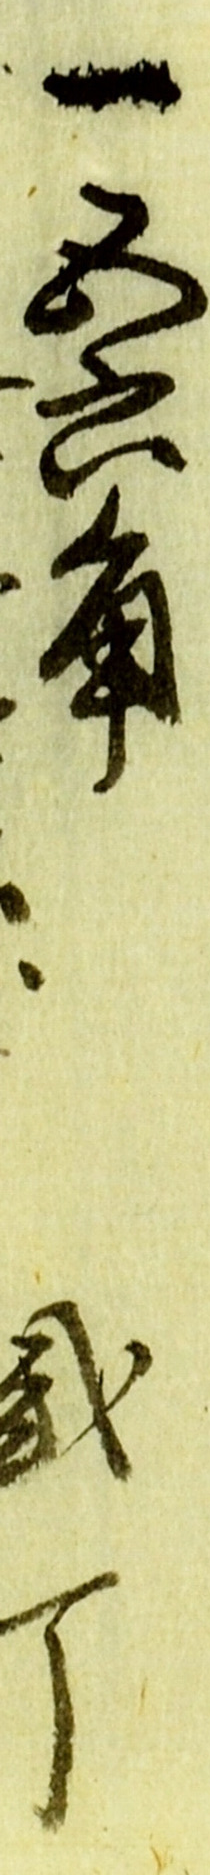一五六角弐丁
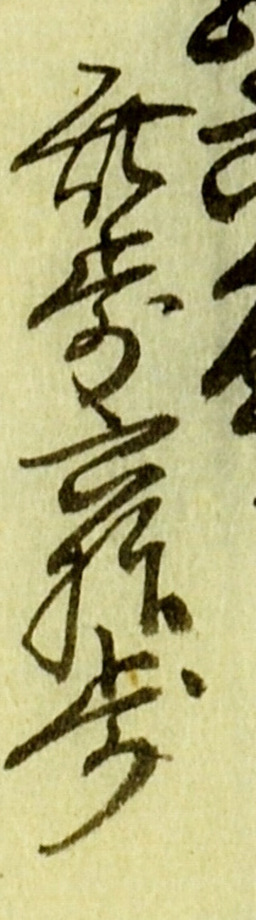此歩六拾歩
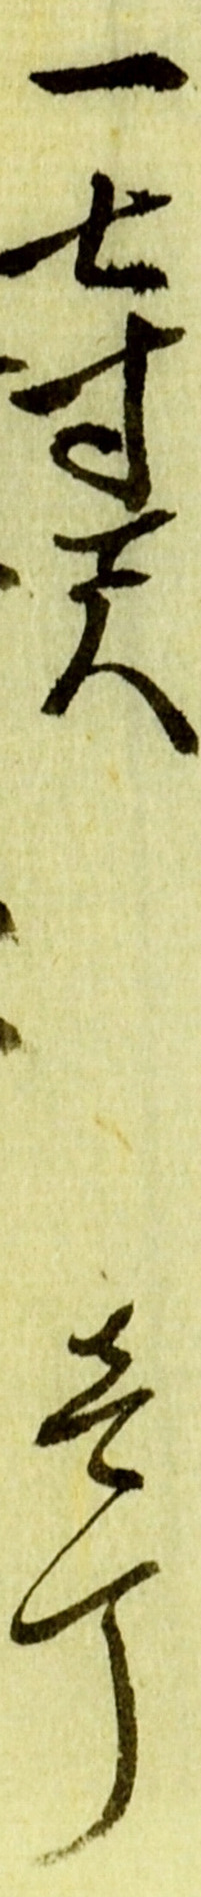一七寸尺壱丁
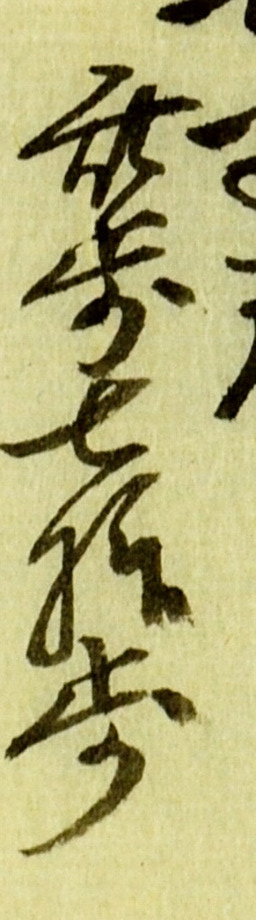此歩七拾歩
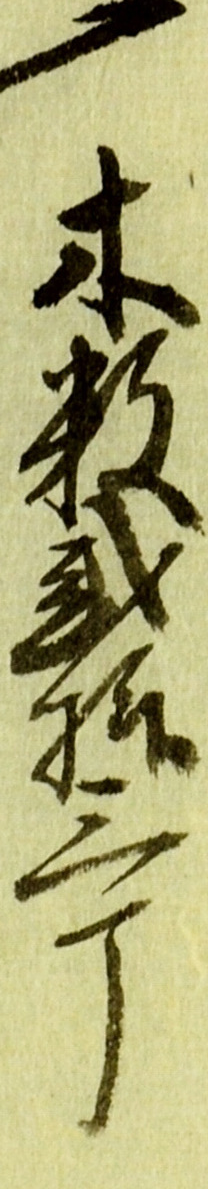木数弐拾三丁
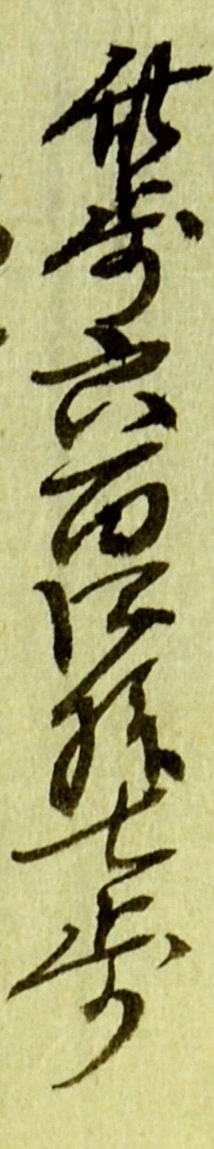〆此歩六百四拾七歩
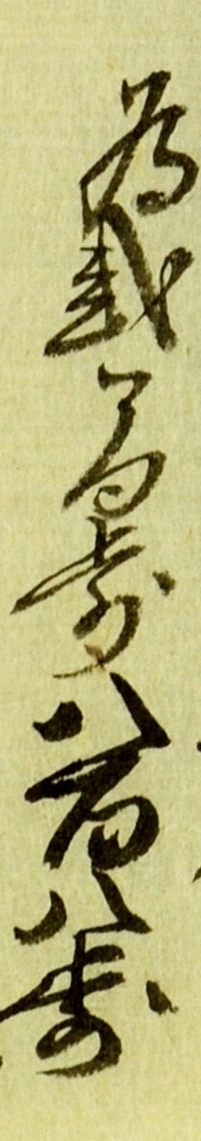為弐百歩八百八歩
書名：材木川下ケ分一上納帳
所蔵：伊那市立高遠町図書館・合同会社AMANE
